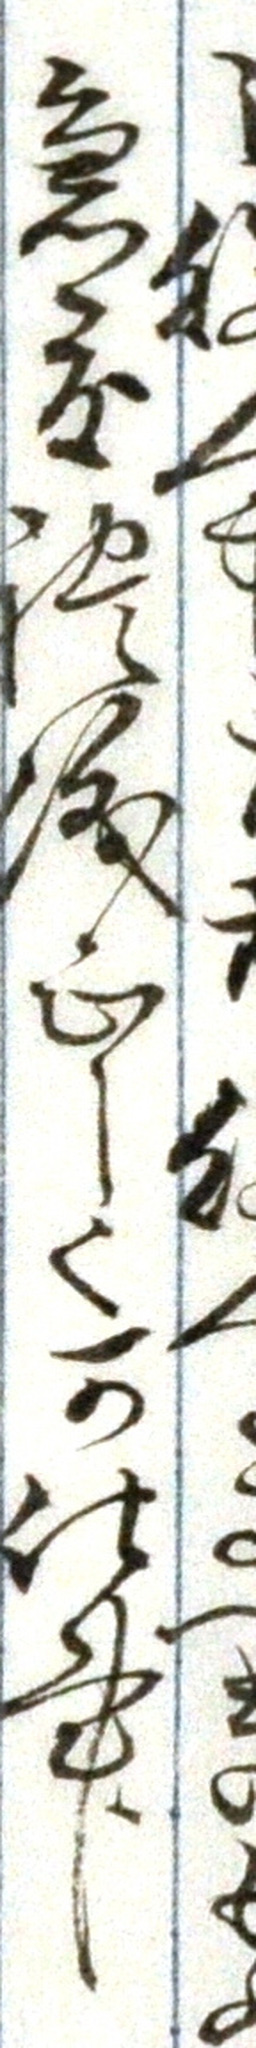急度礼儀正しく可仕事
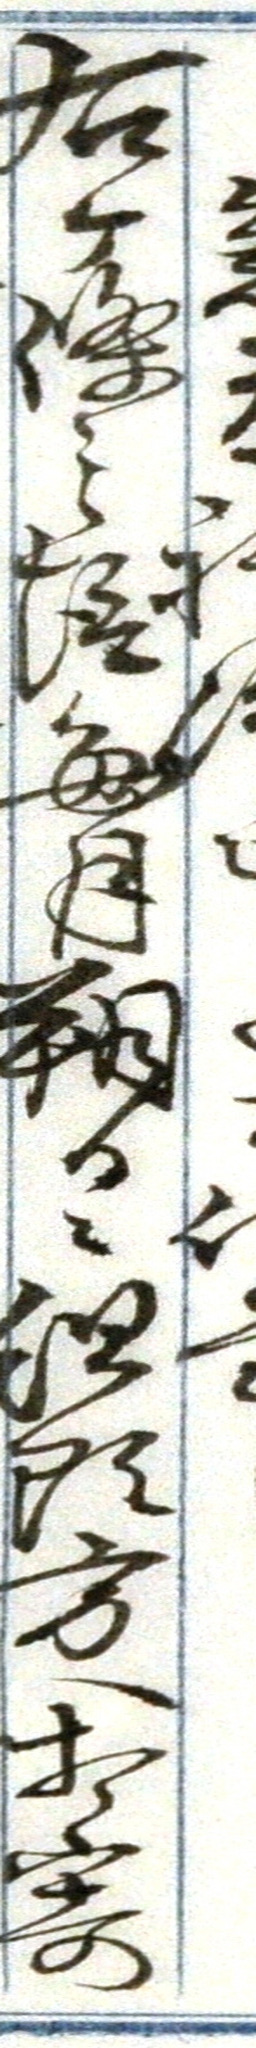右ケ條之趣毎月朔日ニ組頭方へ打寄
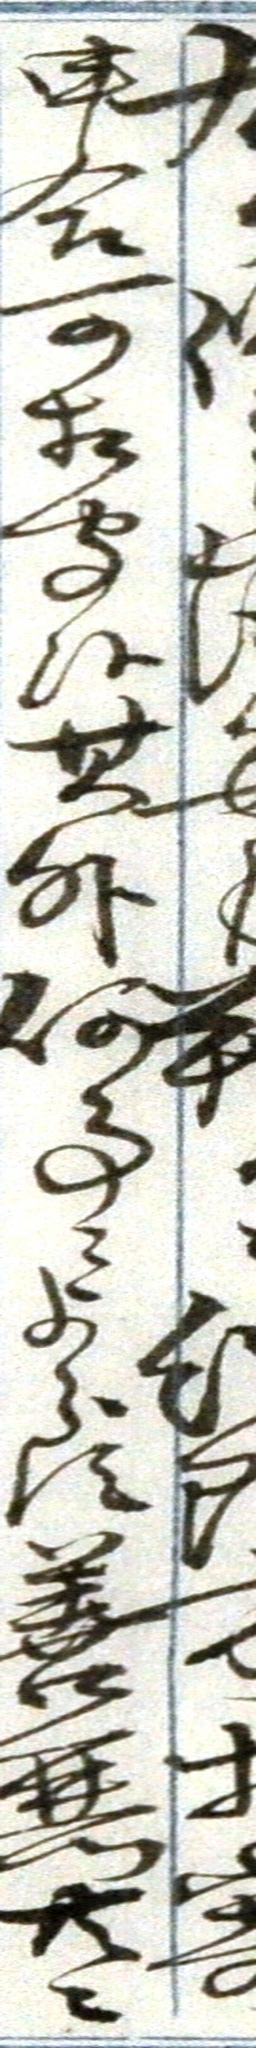申合可相守候其外何事ニよらす善悪共ニ
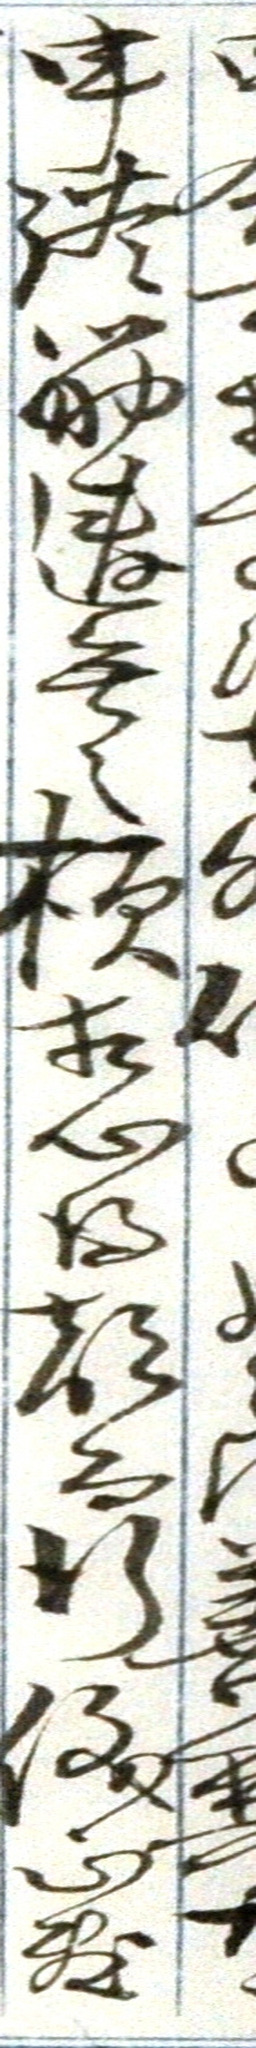申談筋違無之様相心得都而行儀正路
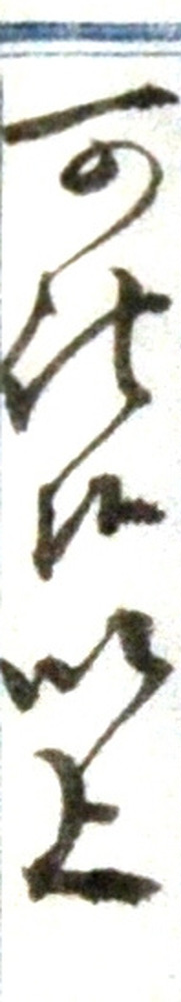可仕候以上

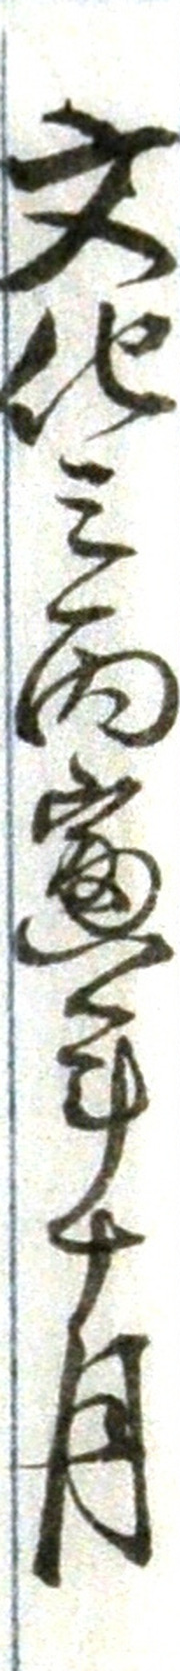文化三丙寅年十月
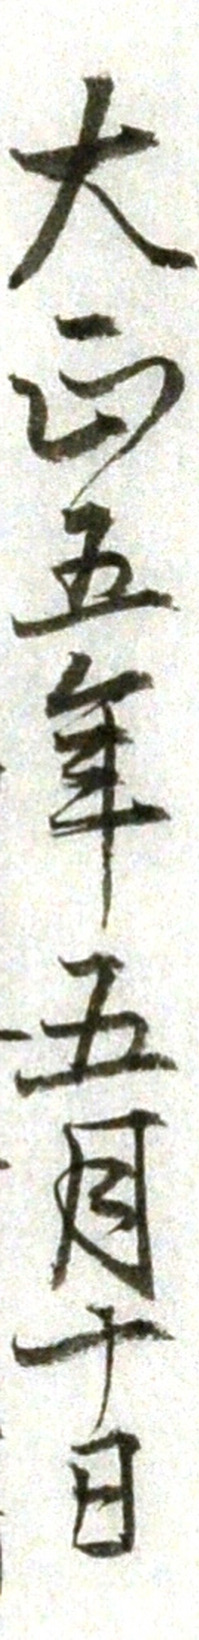大正五年五月十日
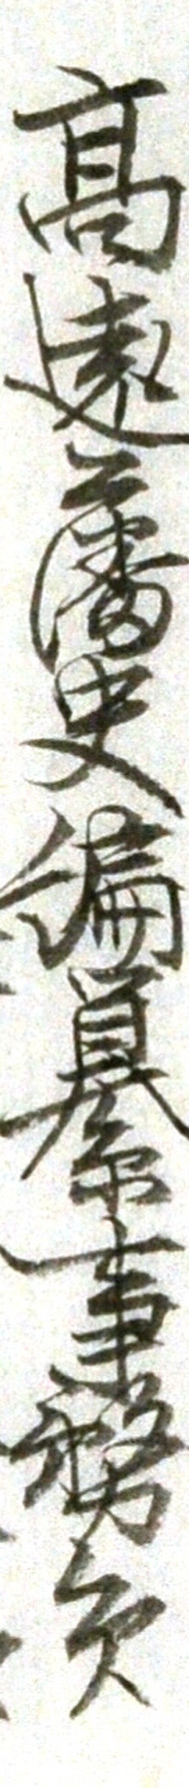高遠藩史編纂事務員
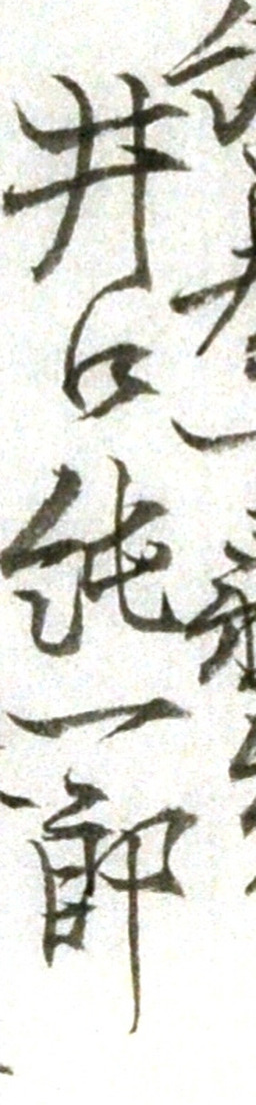井口純一郎
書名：在町組合ヨリ差上候覚書
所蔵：伊那市立高遠町図書館・合同会社AMANE
